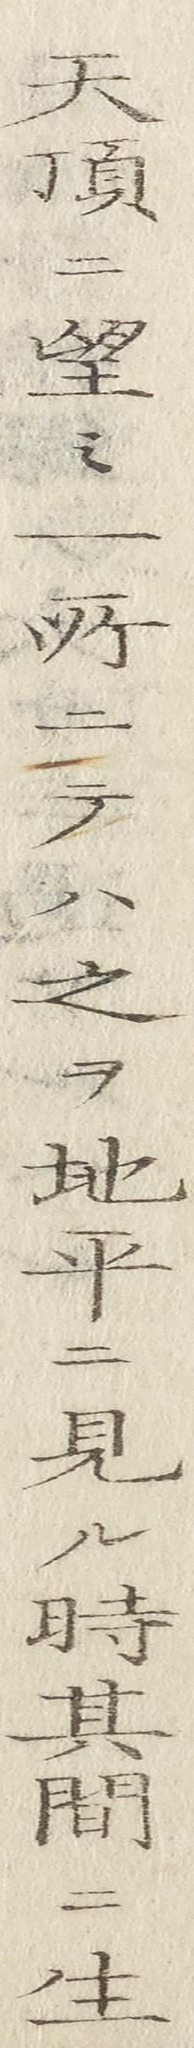天頂ニ望ミ一所ニテハ之ヲ地平ニ見ル時其間ニ生
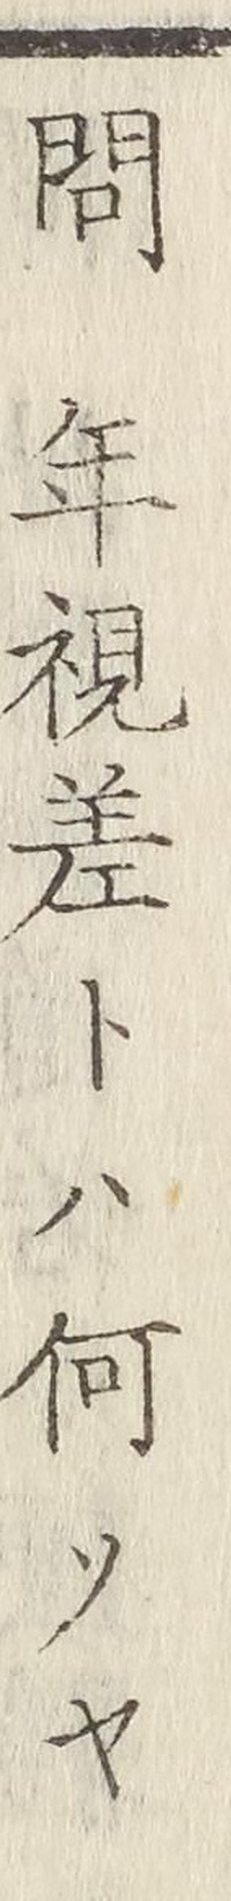問年視差トハ何ソヤ
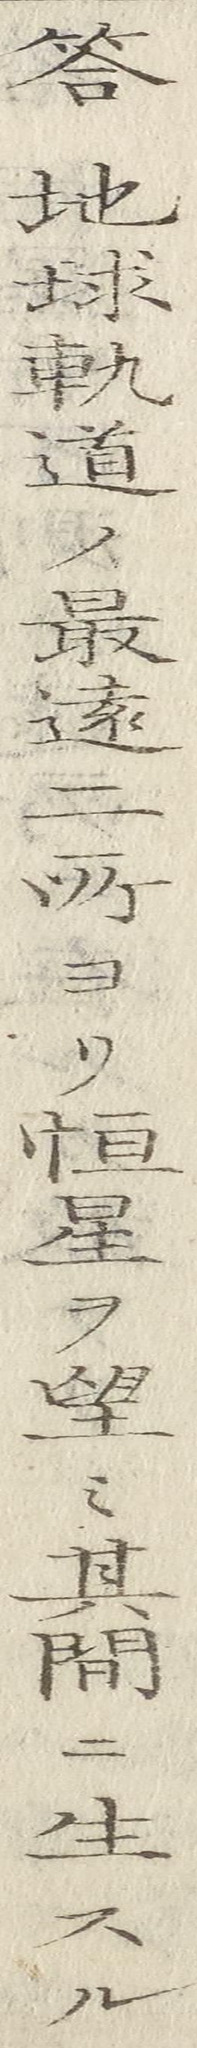答地球軌道ノ最遠ニ所ヨリ恒星ヲ望ミ其間ニ生スル
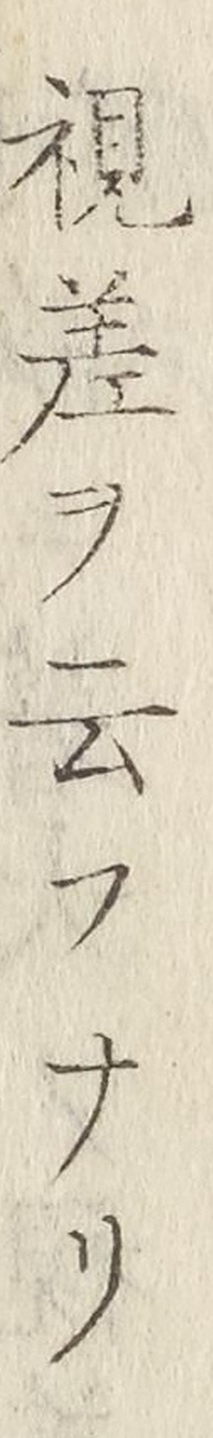視差ヲ云フナリ
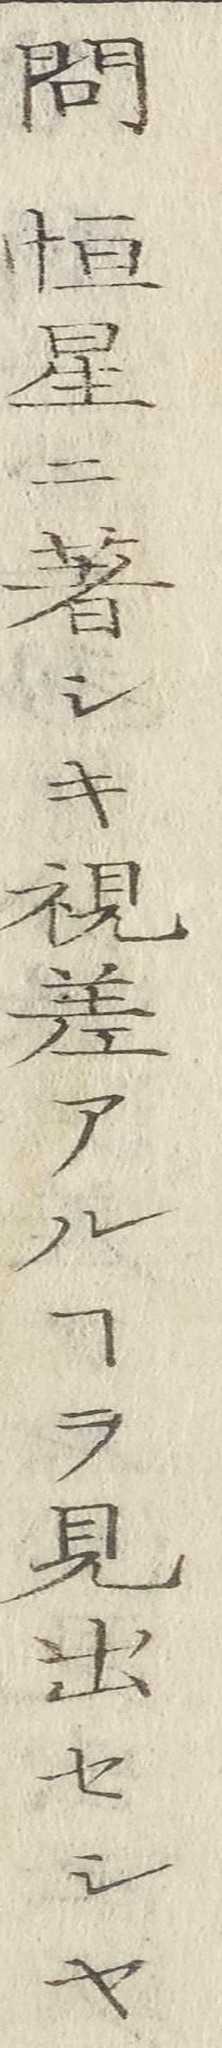問恒星ニ著シキ視差アルコトヲ見出セシヤ

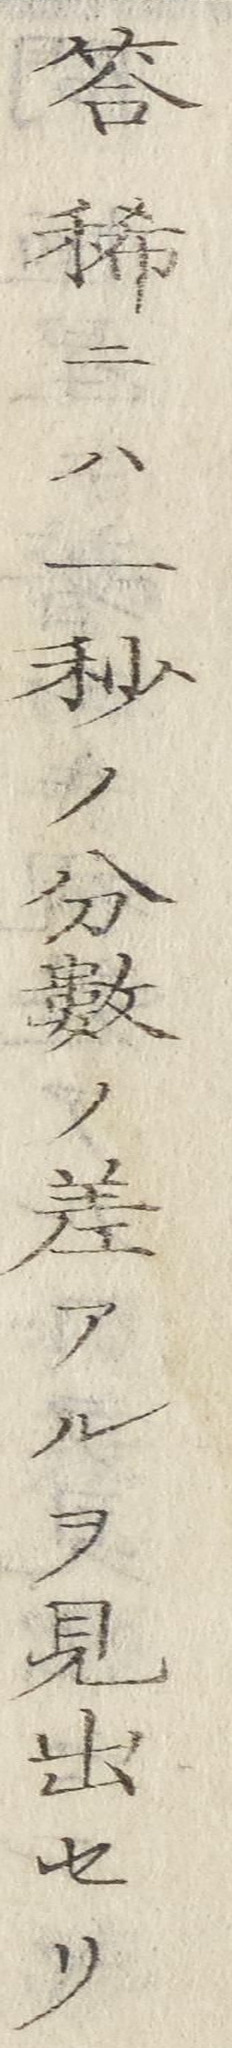答稀ニハ一秒ノ分数ノ差アルヲ見出セリ
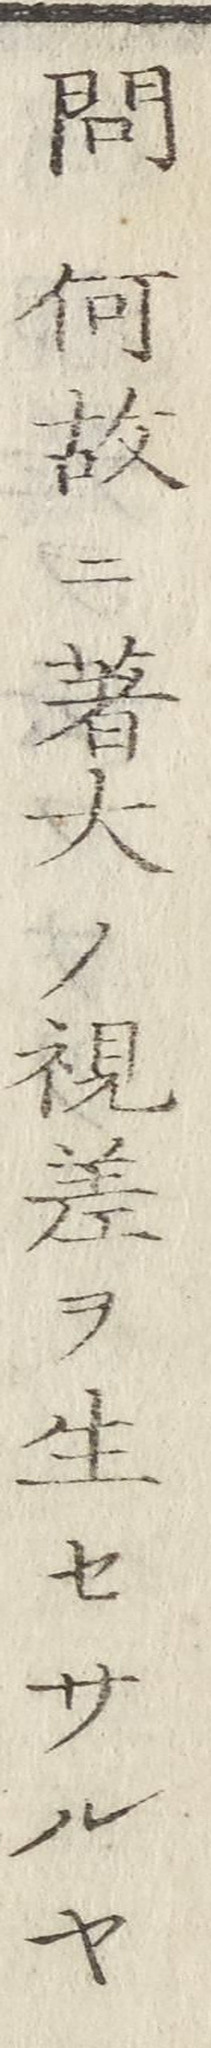問何故ニ著大ノ視差ヲ生セサルヤ
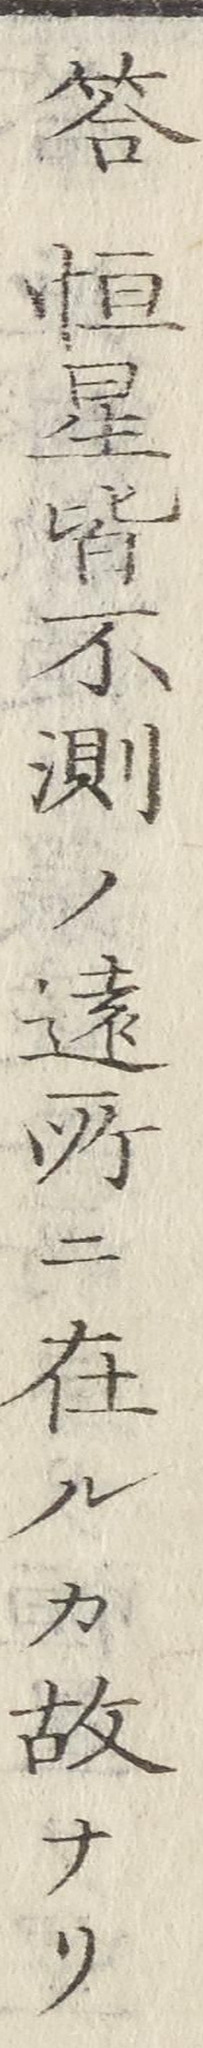答恒星皆不測ノ遠所ニ在ルカ故ナリ
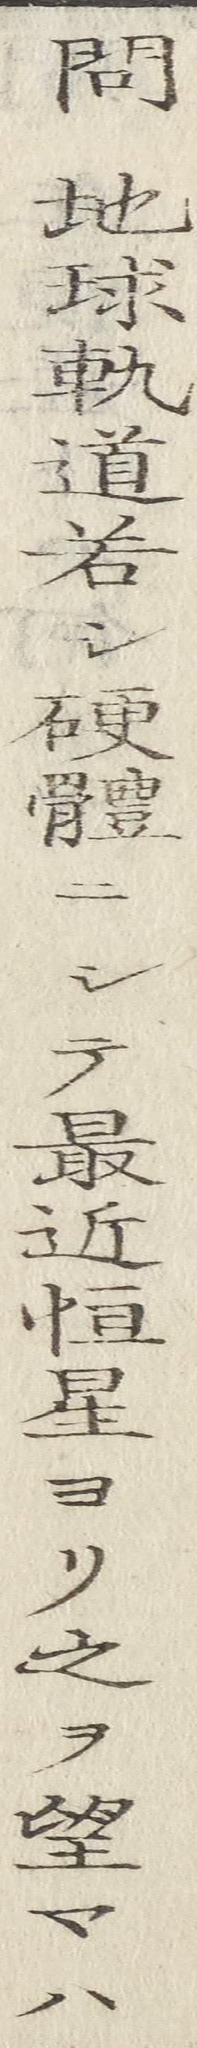問地球軌道若シ硬体ニシテ最近恒星ヨリ之ヲ望マハ
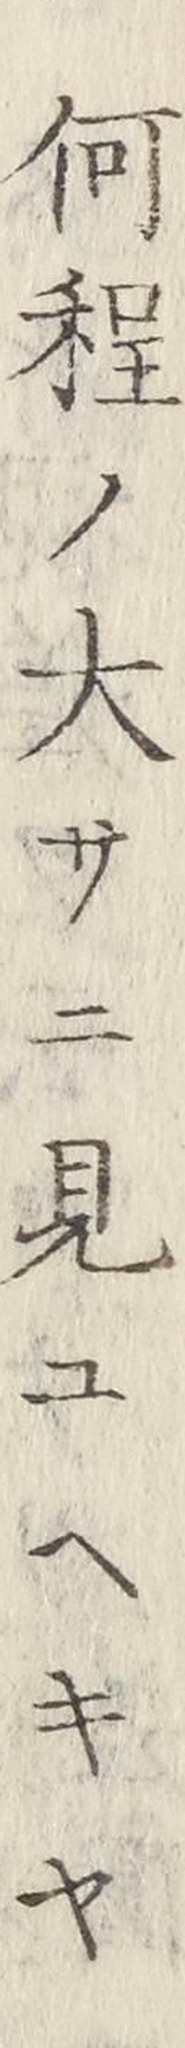何程ノ大サニ見ユヘキヤ
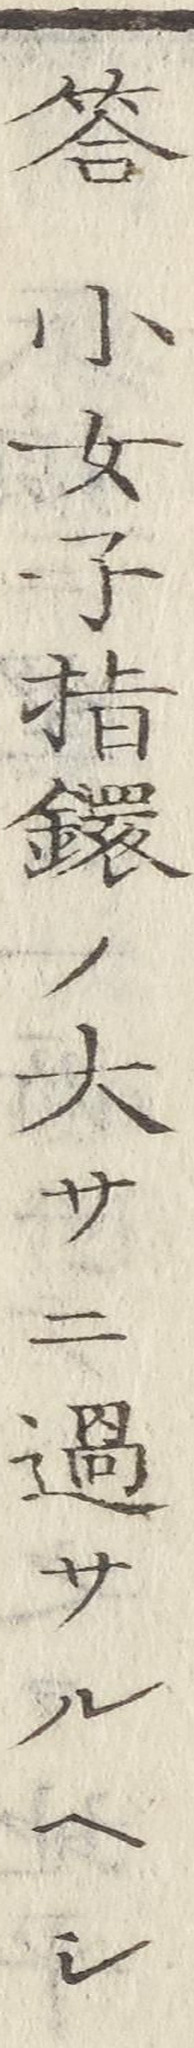答小女子指鐶ノ大サニ過サルヘシ
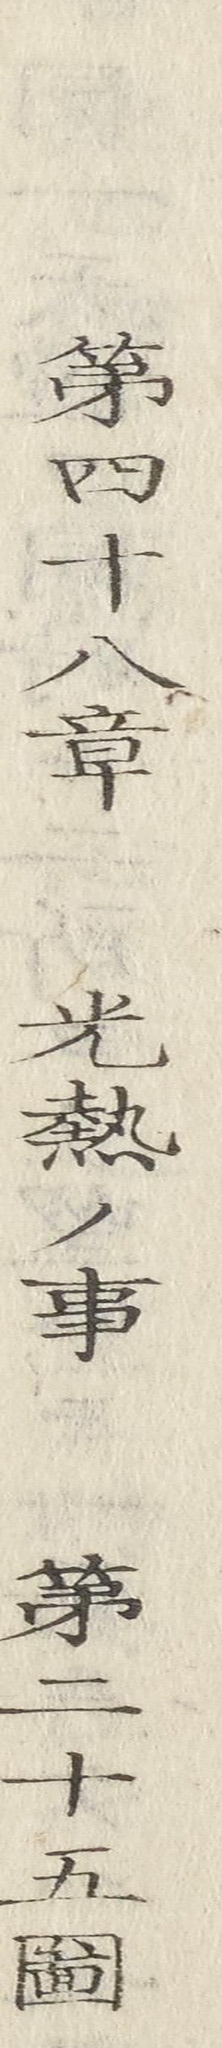第四十八章光熱ノ事第二十五図
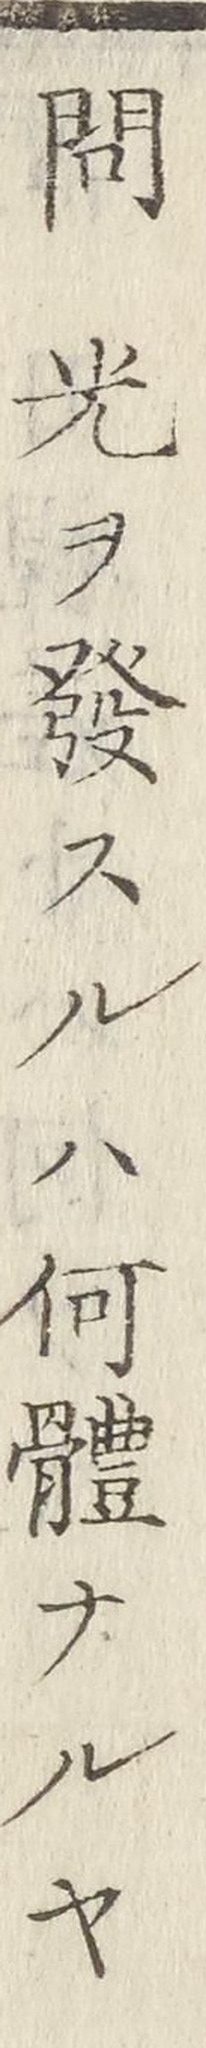問光ヲ発スルハ何体ナルヤ
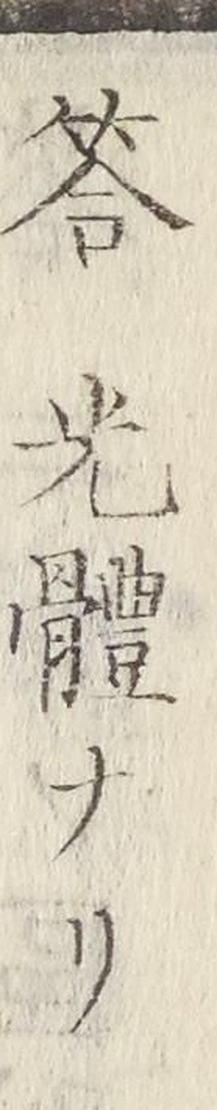答光体ナリ
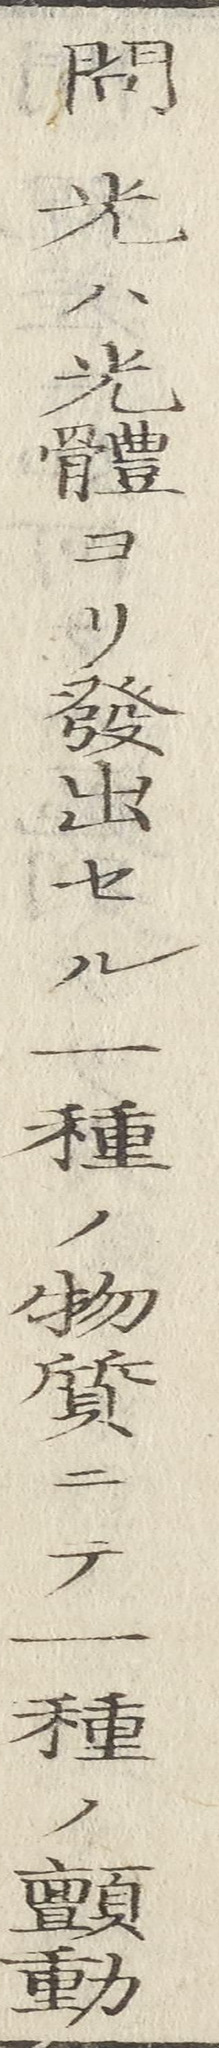問光ハ光体ヨリ発出セル一種ノ物質ニテ一種ノ顫動
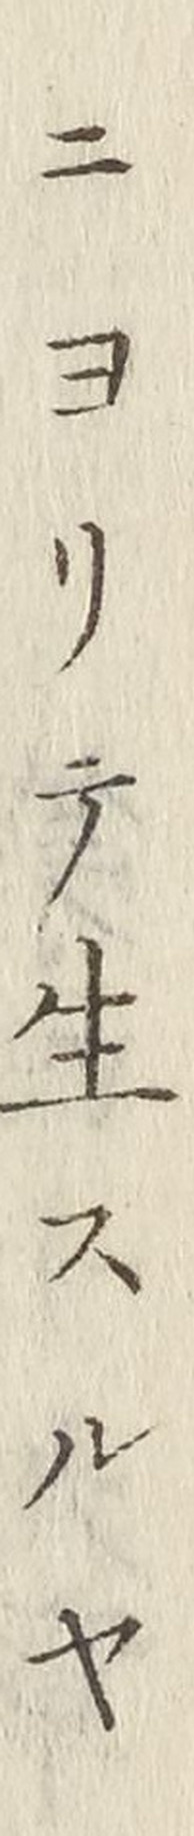ニヨリテ生スルヤ
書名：星学圖説　下
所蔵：東京大学地震研究所図書室 Earthquake Research Institute Library, The University of Tokyo, JAPAN
